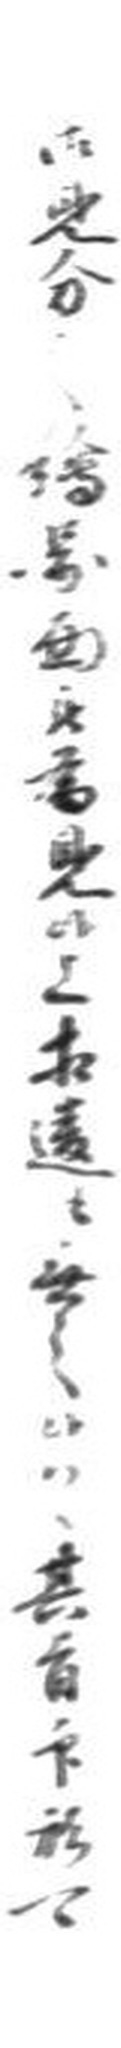御見分之絵図面被為見候上相違も無之候ハヽ其旨印形可
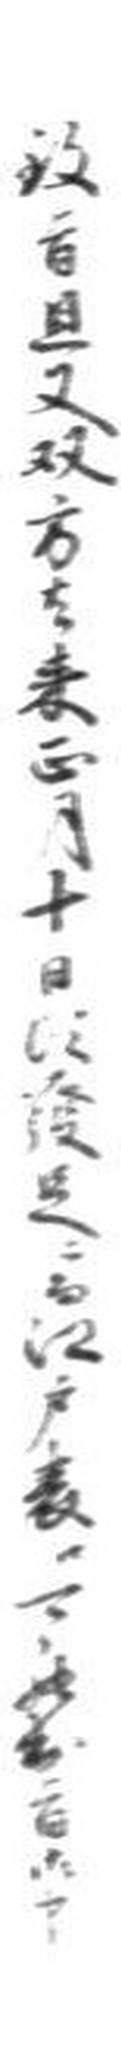致旨且又双方共来正月十日頃発足ニ而江戸表江可罷出旨御申
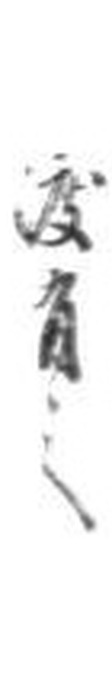渡有之
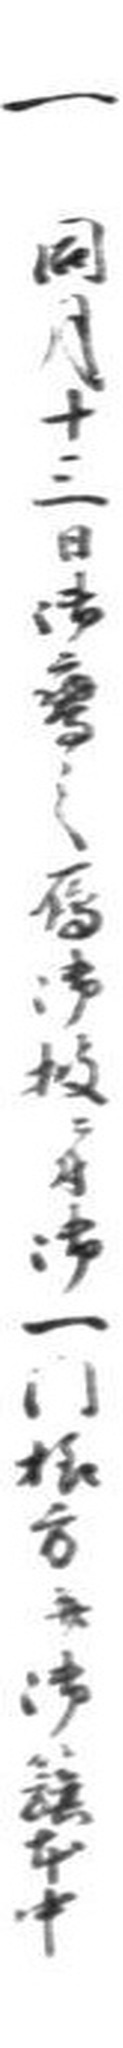一同月十三日御鷹之鳫御披ニ付御一門様方并御旗本中

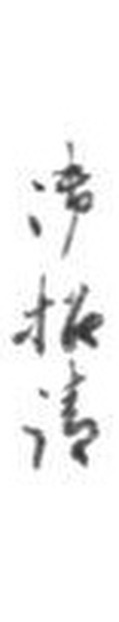御招請
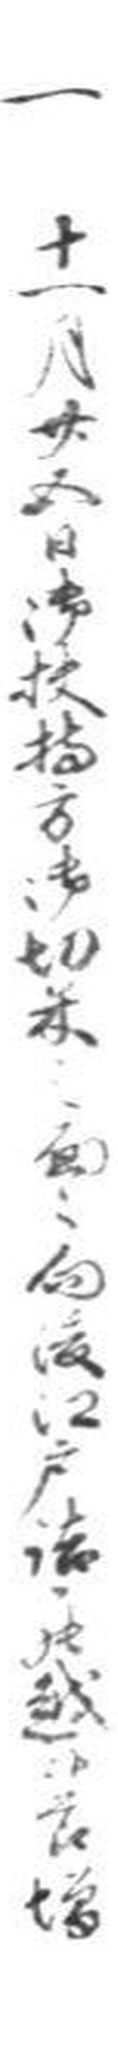一十一月廿五日御扶持方御切米之面々向後江戸詰罷越候節増
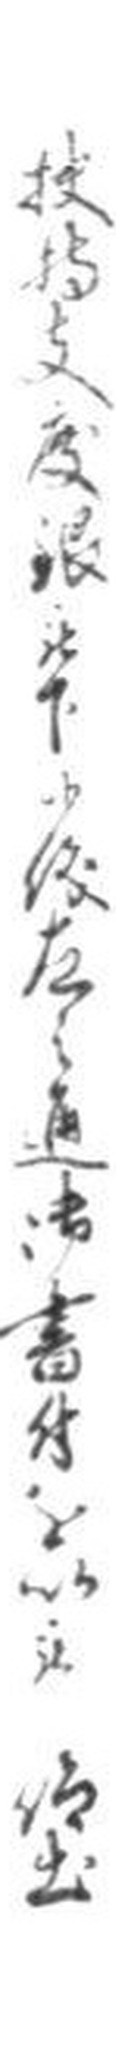扶持支度銀被下候儀左之通御書付を以被仰出
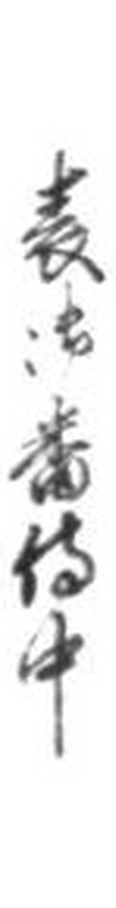表御番侍中
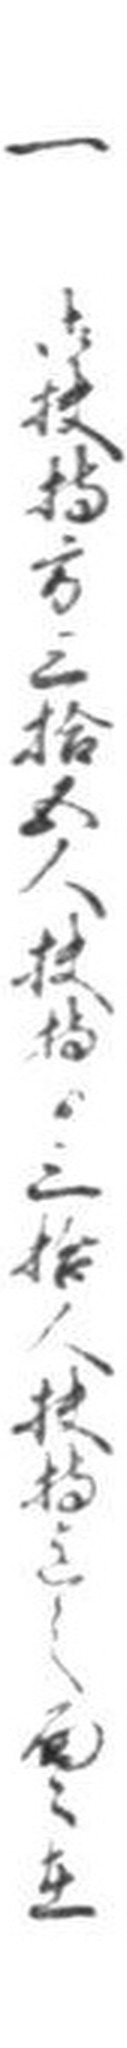一御扶持方三拾五人扶持ゟ三拾人扶持迄之面々在
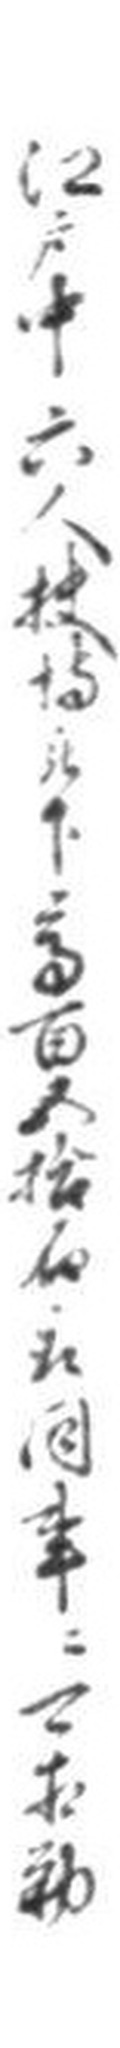江戸中六人扶持被下高百五拾石取同事ニ可相勤
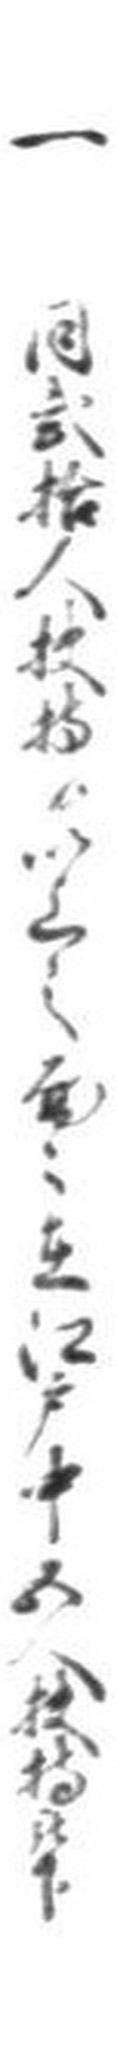一同弐拾人扶持ゟ以上之面々在江戸中五人扶持被下
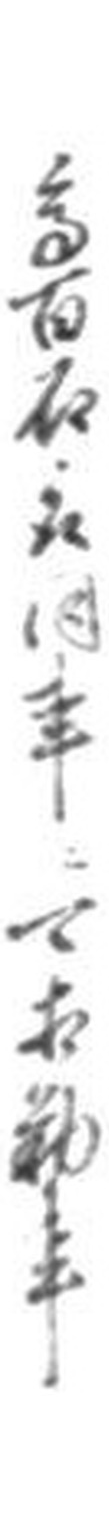高百石取同事ニ可相勤事
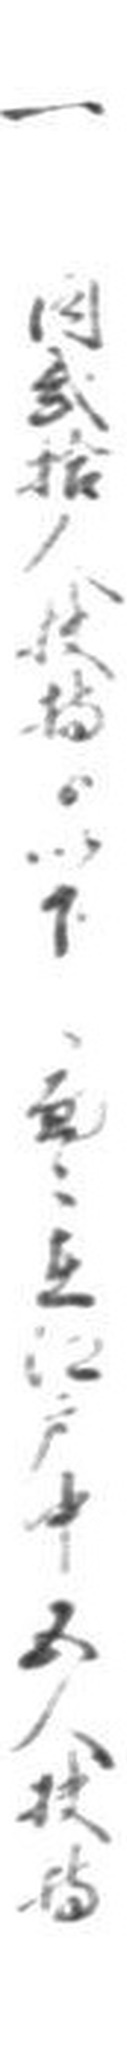一同弐拾人扶持ゟ以下之面々在江戸中五人扶持
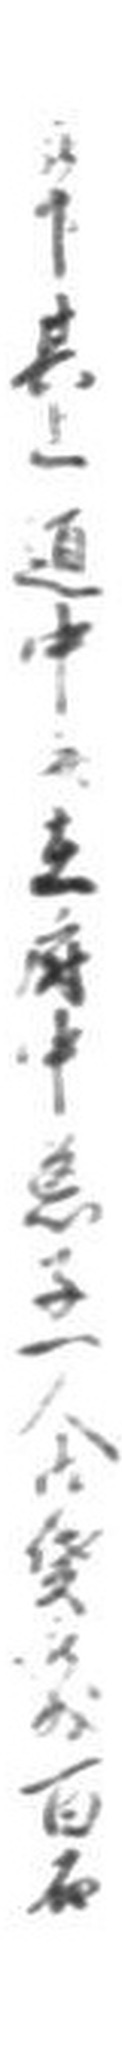被下其上道中并在府中荒子一人御貸被成百石
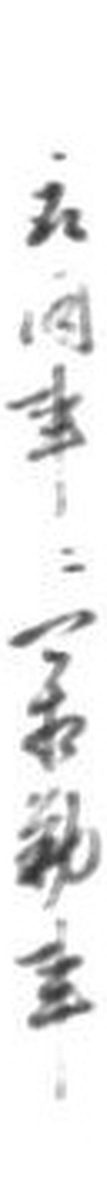取同事ニ可相勤事
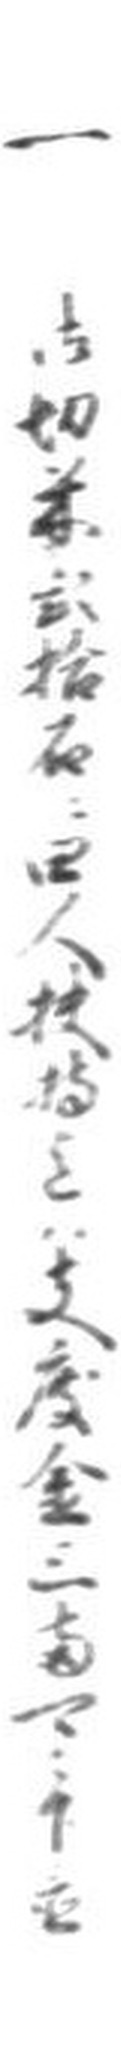一御切米弐拾石ニ四人扶持迄ハ支度金三両可被下置
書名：家譜 三十六 宗昌公 従享保八年到同九年
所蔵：福井県文書館 Fukui Prefectural Archives
